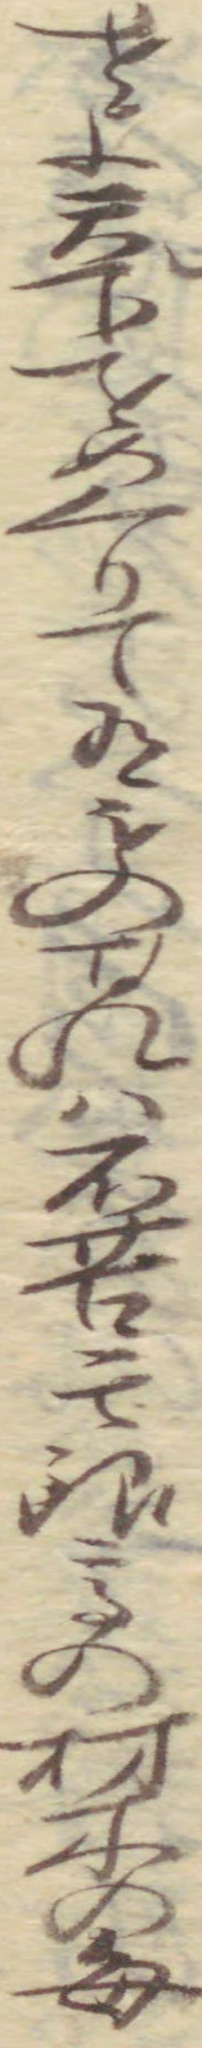せよ天下をめくりて有ものなれは不苦其銀高の材木の毎
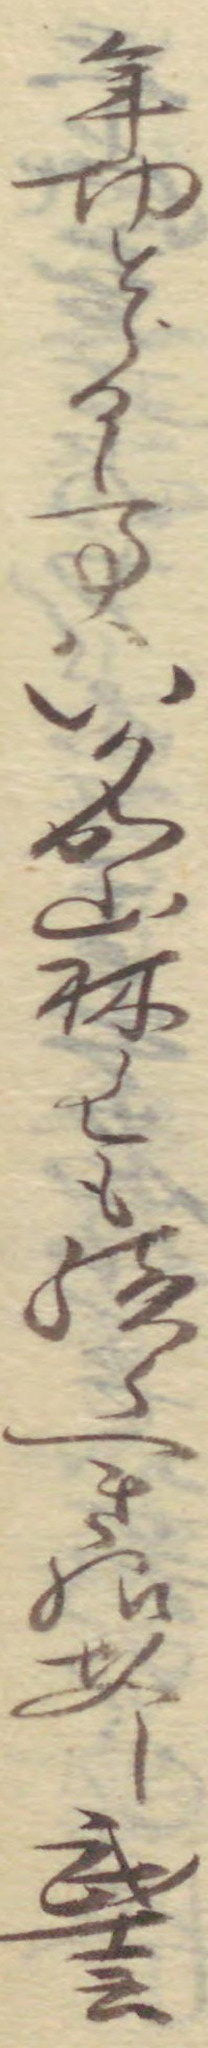年切とらるゝ事はいか成山林ニても続くへき様なし武士云
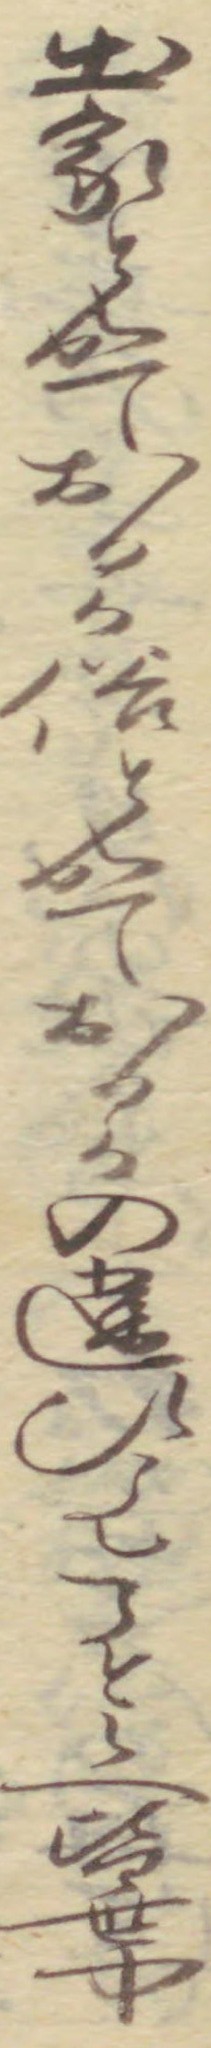出家と成ておるか俗と成ておるかの違ひニてこそ候へ皆世中
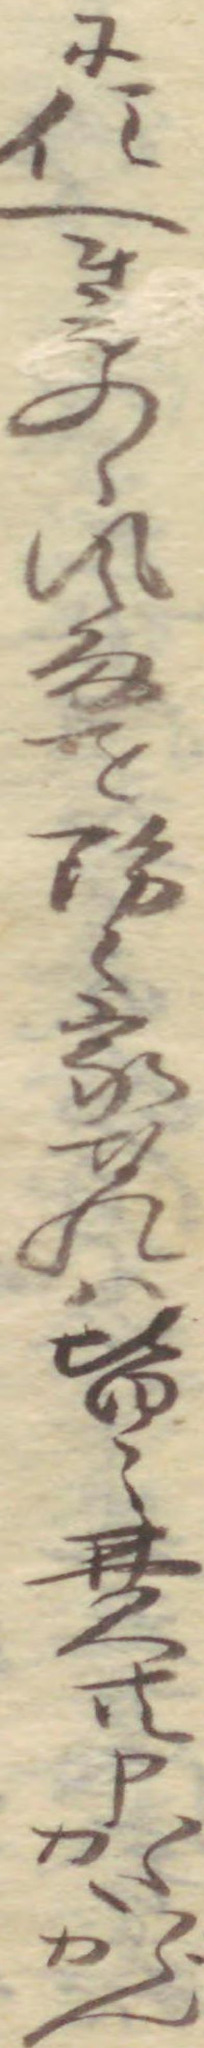に住へきものゝ風雨を防く家なれは皆〻費共申かたからん
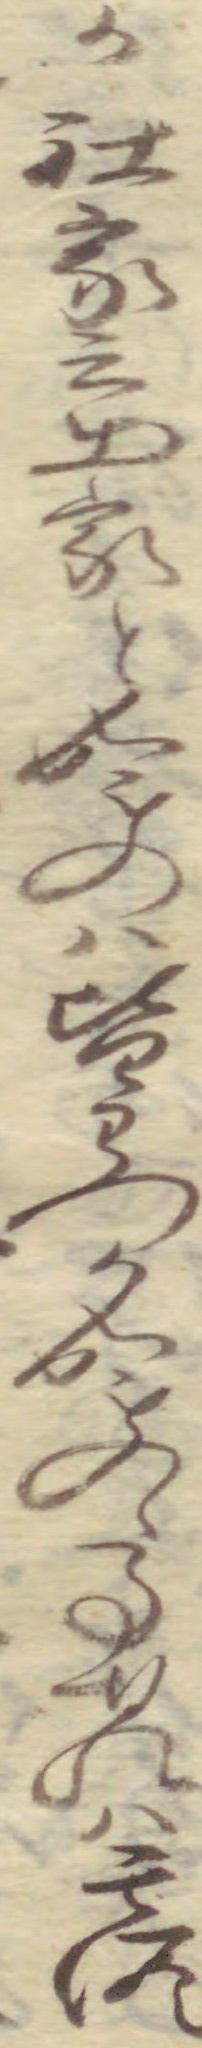か社家云出家と成ものは皆わつか成ものゝ事なれは其侭
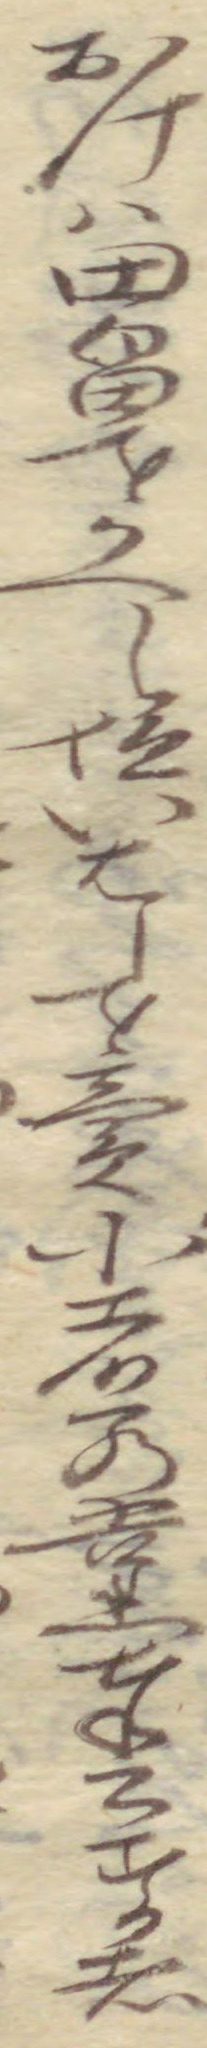おけは田畠をかへし塩いはしを売小者若党奉公する者
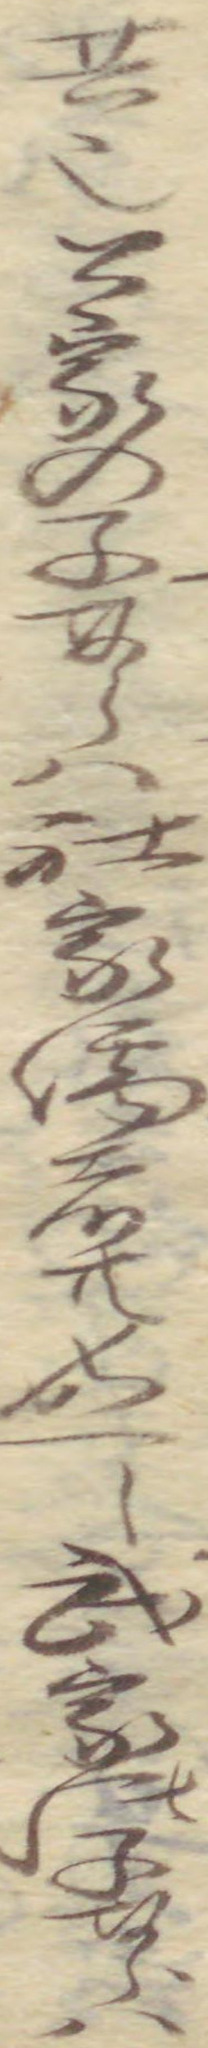共也公家の子ならは社家儒者共成へし武家の子ならは
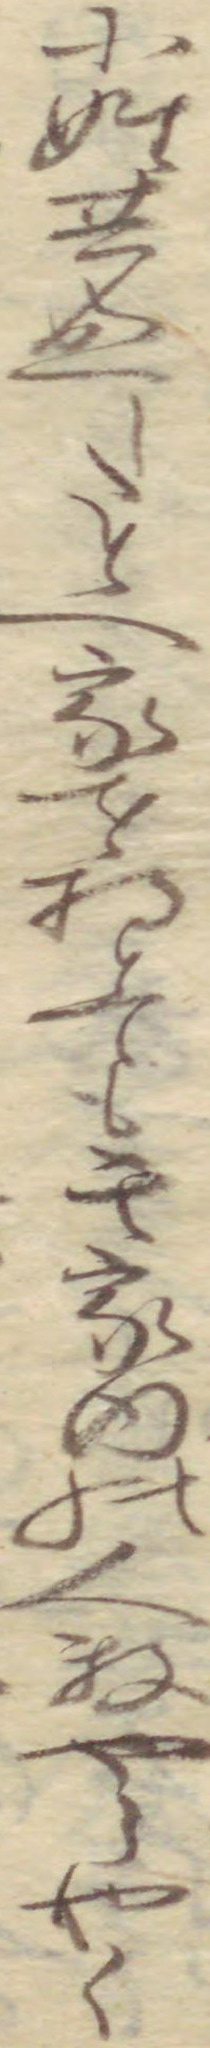小姓共成へしたとへ家を持とても其家内の人数やうやく
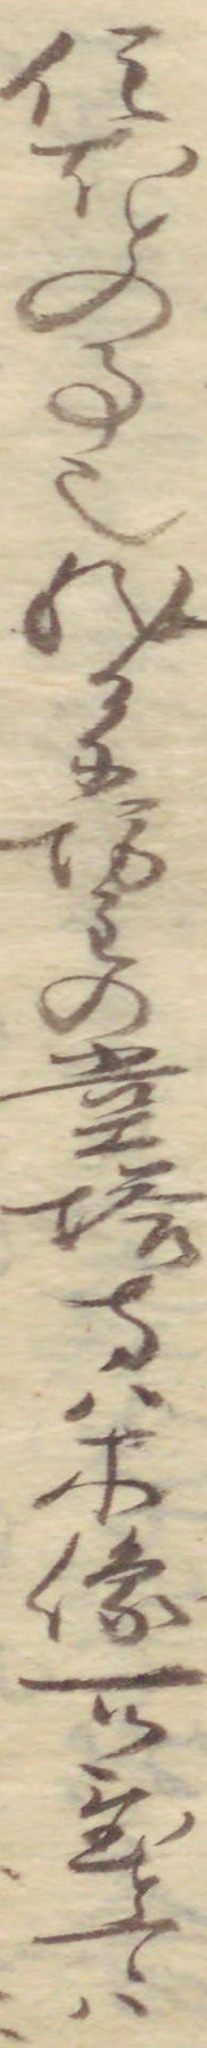住ほとの事也然るに坊主の堂塔寺は木像一ツ置とては
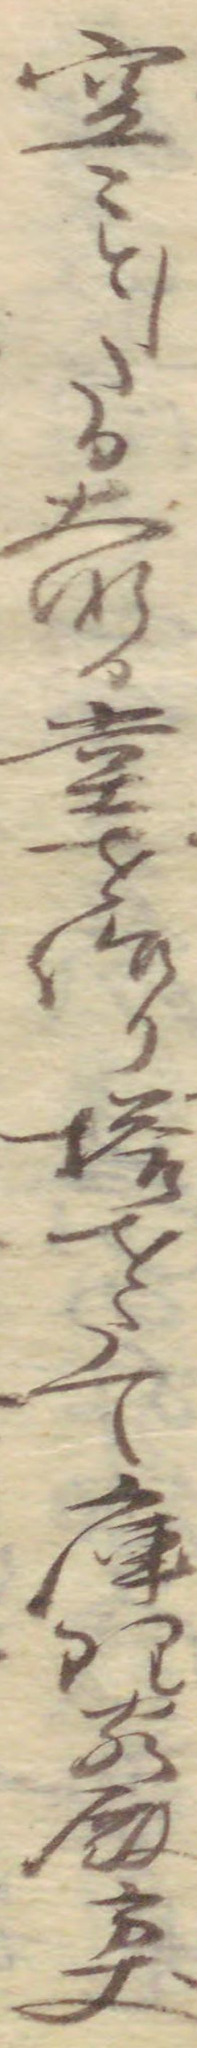空〻としたる大なる堂を作り塔をたて庫理客殿方丈
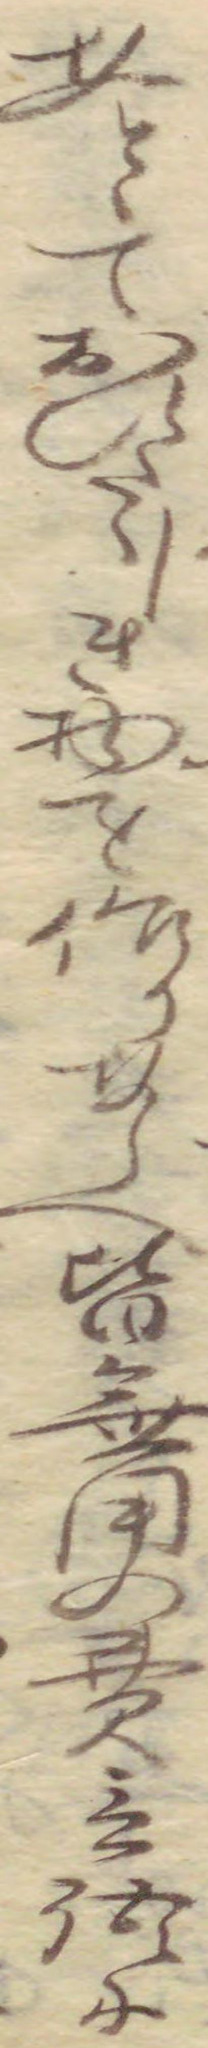なとゝておひたゝしき物を作りならへ皆無用の費言語に
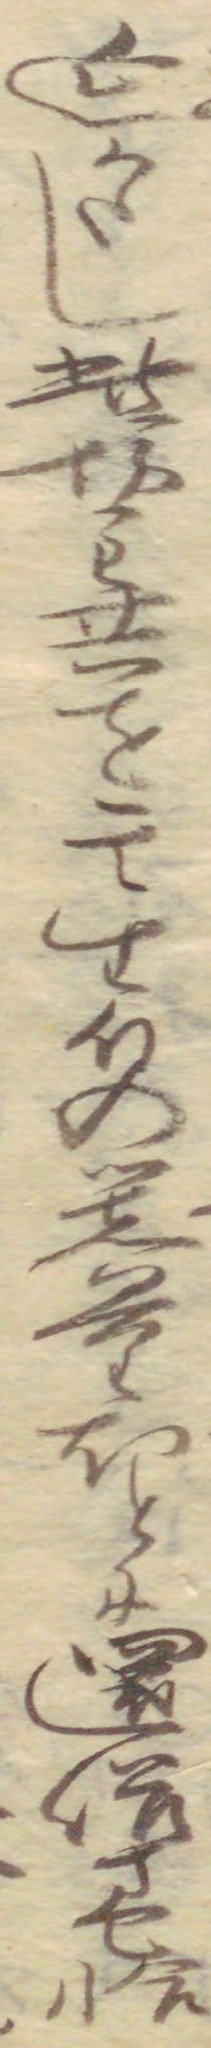延かたし此坊主共を其生付の器量ほとに還俗させ恰
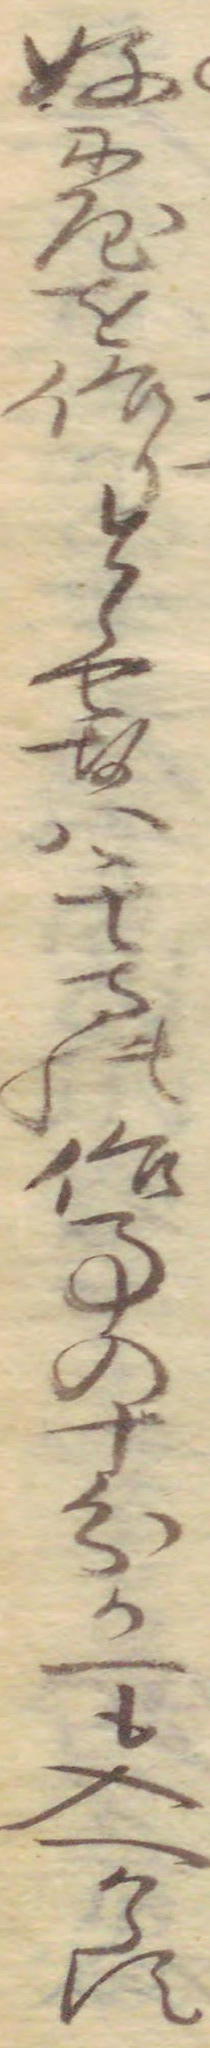好に屋を作りとらせなは其寺の作事の十分か一も入へからす

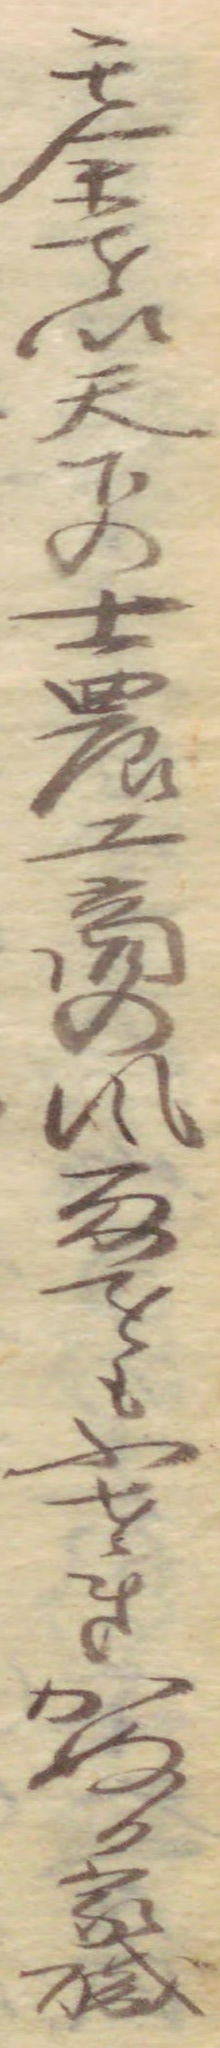其余を以天下の士農工商の風雨をもふせきかぬる家職
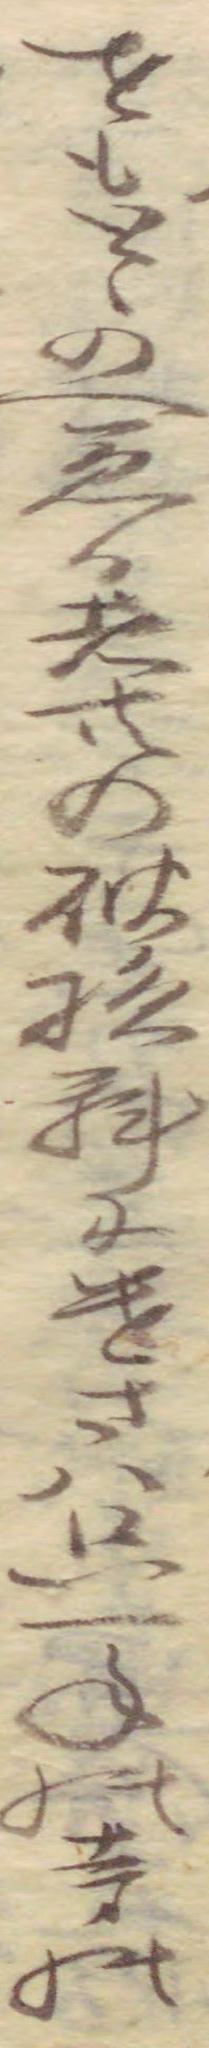をもとゝのへゑる者共の破損料を遣さは只一年の寺の
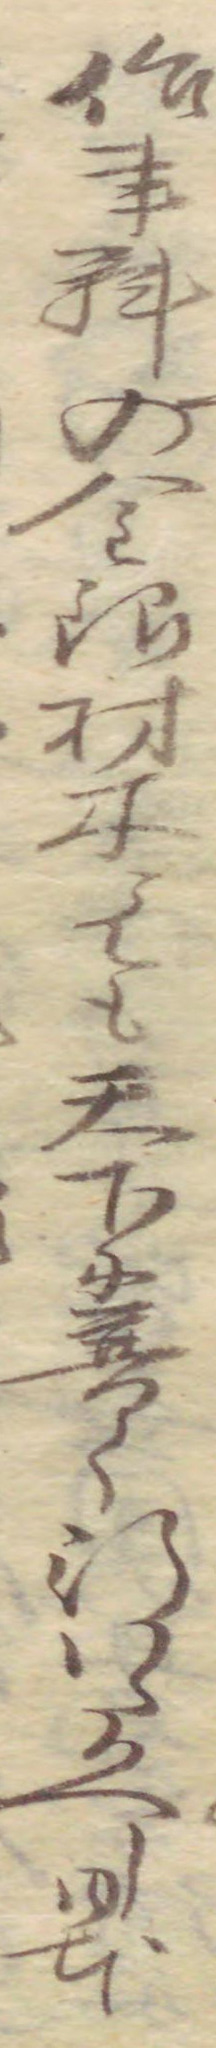作事料の金銀材木ニても天下に普く行わたるへし日本
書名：鶯宿雑記. 巻263-264
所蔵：国立国会図書館 National Diet Library, JAPAN
